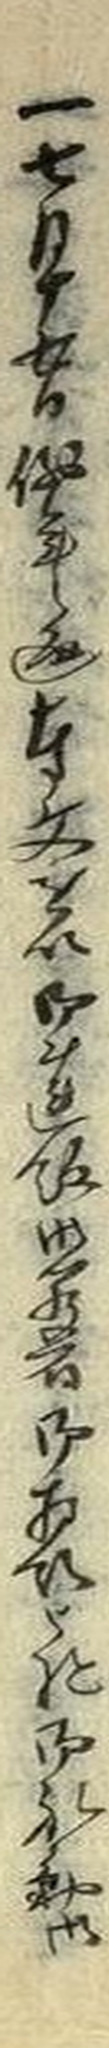一七月十五日例年之通奉文を以御蓮飯御箱肴御拝領被遊御礼勤御
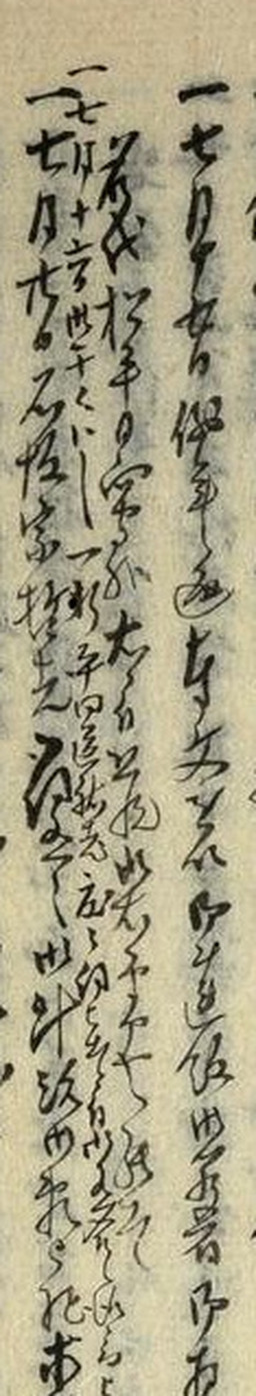名代松平日向守様右ニ付恐悦御右筆部やへ罷出候
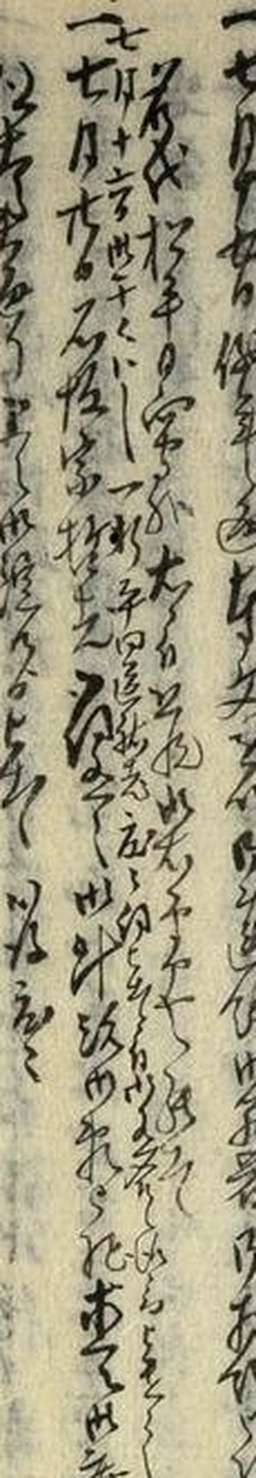一七月十六日御干くハし一折平田道祐老度々伺被出候ニ付御有合之趣ニ而被遣之
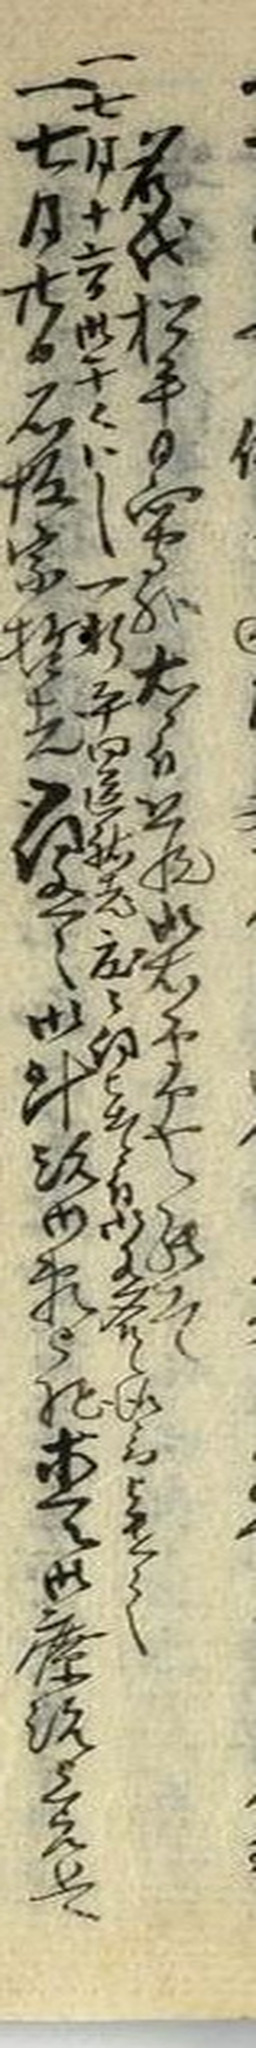一七月廿日石坂宗哲老御伺有之御針治御頼被遊直ニ御療治差上候
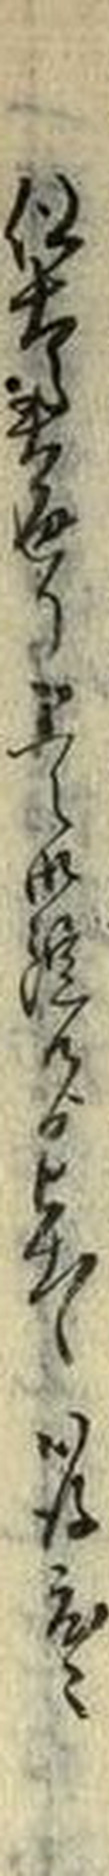但大奥通り上之御錠口ゟ被出候以後度々
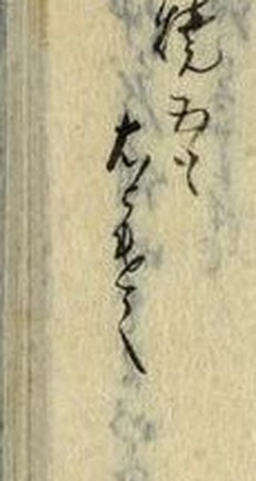右被遣之

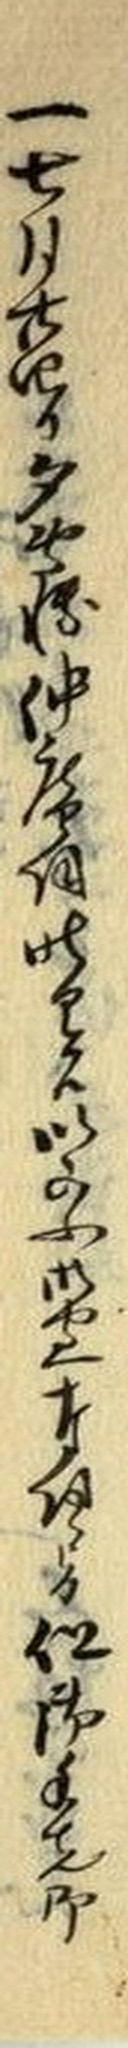一七月廿四日夕専博仲庵伺昨日とハ以の外御宜奉伺候旨但御手先御
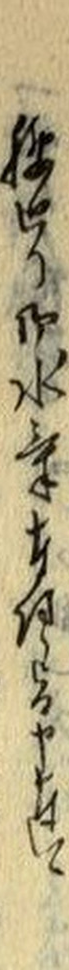腰廻り御水気奉伺候旨申達候
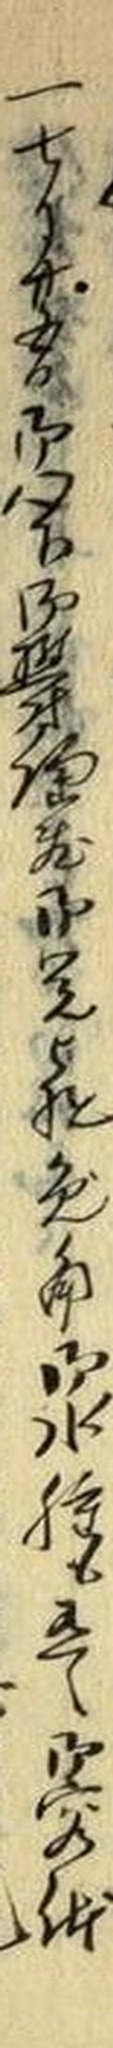一七月廿五日御心下御鬱陶敷御覚被遊兎角御水腫も有之御容体
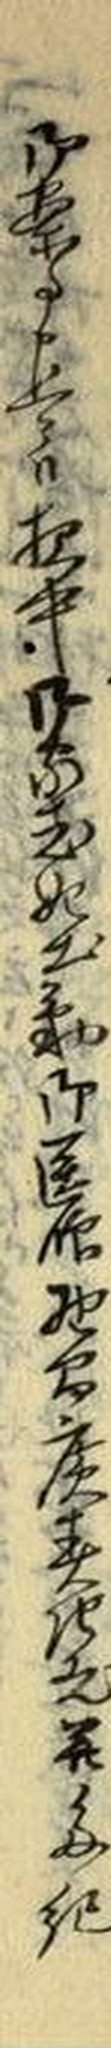御案事申上候付夜中御家老始出勤御医師野間広春院老并多紀
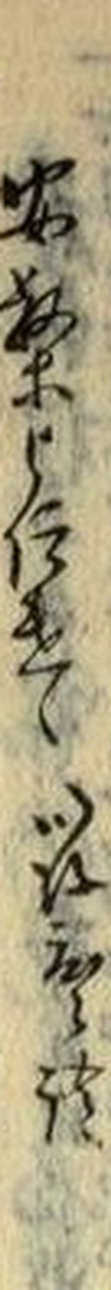安叔等被仰遣候以後度々詰
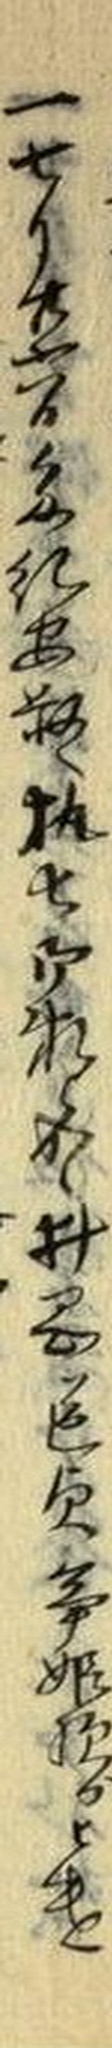一七月廿六日多紀安叔へ執匙御頼被成候井岡道貞箏姫様ゟ被遣
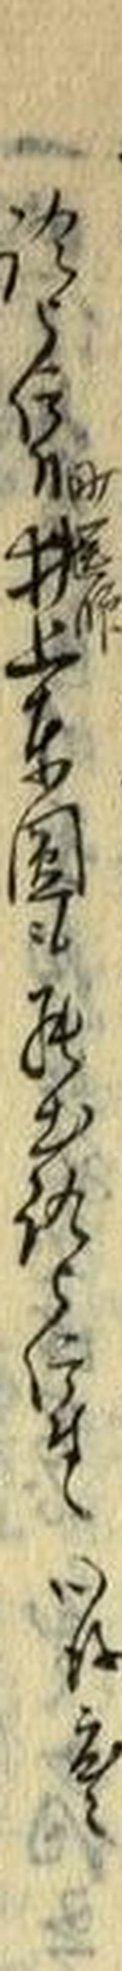診被仰付町医師井上東円も罷出診被仰付候以後度々
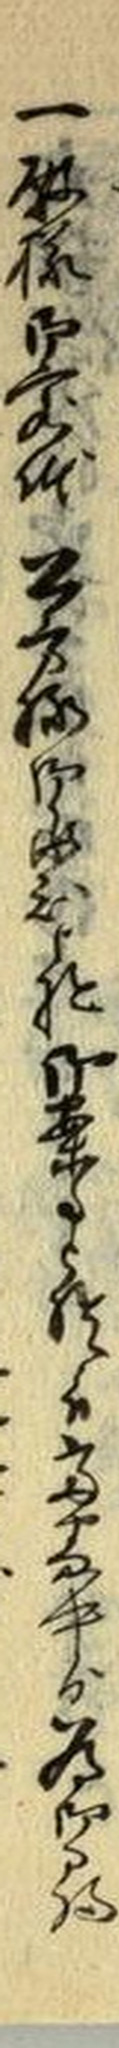一殿様御容体公方様御承知被遊御安事被遊候ニ付当番中ゟ為御尋
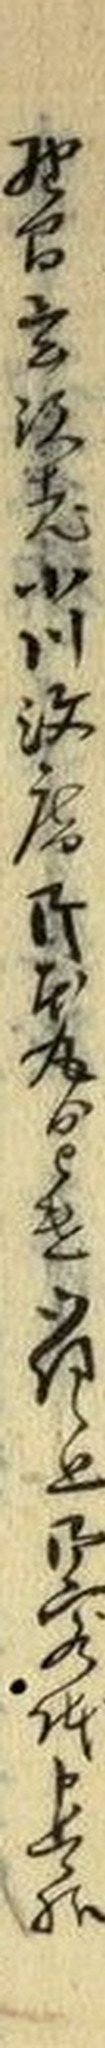野間玄沢老小川汶庵御本丸ゟ被遣御伺之上御容体申上候様
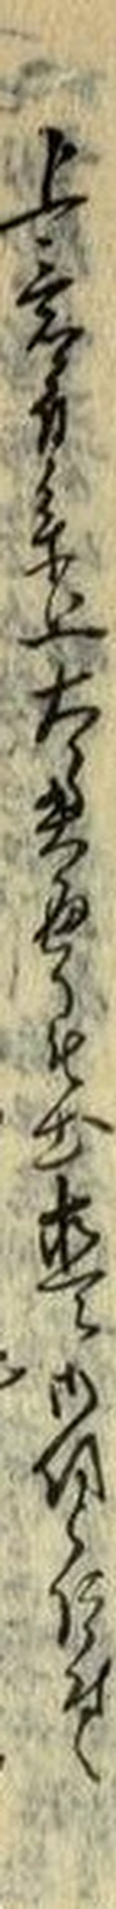上意ニ付参上大奥通り被出直々御伺被仰付候
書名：少傅日録抄（斉承付側向頭取日記、在府）
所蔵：福井県文書館 Fukui Prefectural Archives
